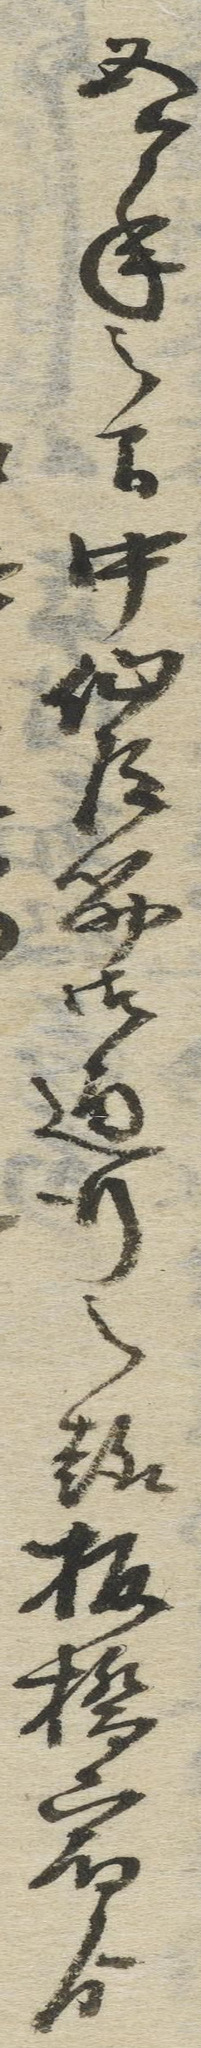五ヶ年之間中仙道筋御通行之趣板橋宿ゟ
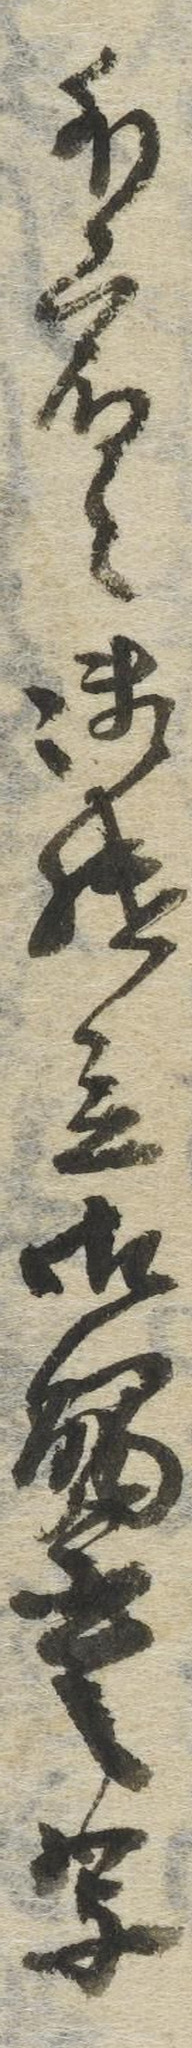外宿々御継立御触書之写
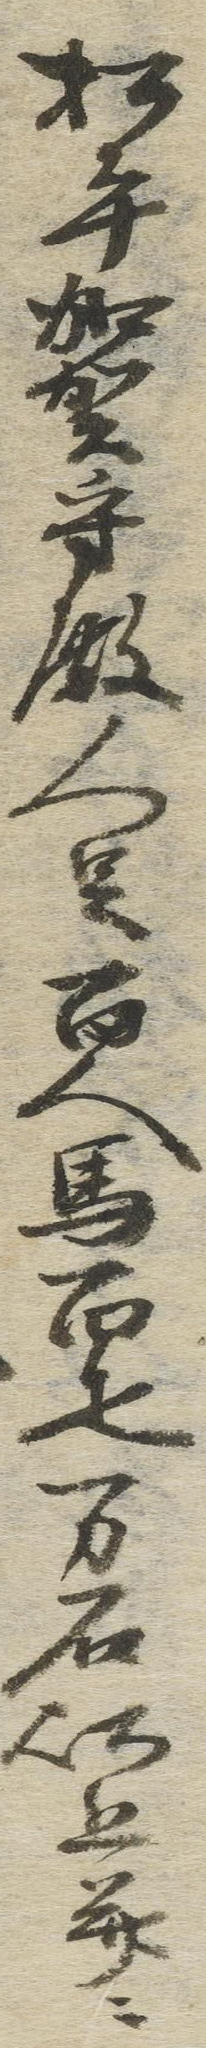松平加賀守殿人足百人馬百七万石以上并二
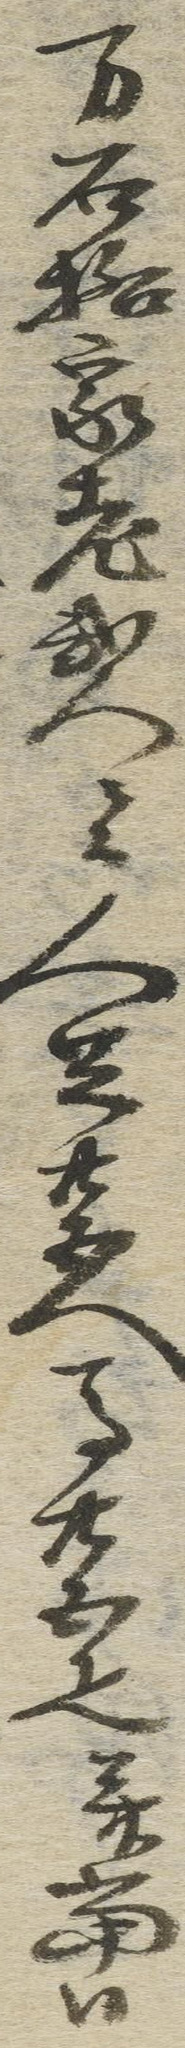万石格家老弐人二而人足廿五人馬廿五疋并当日
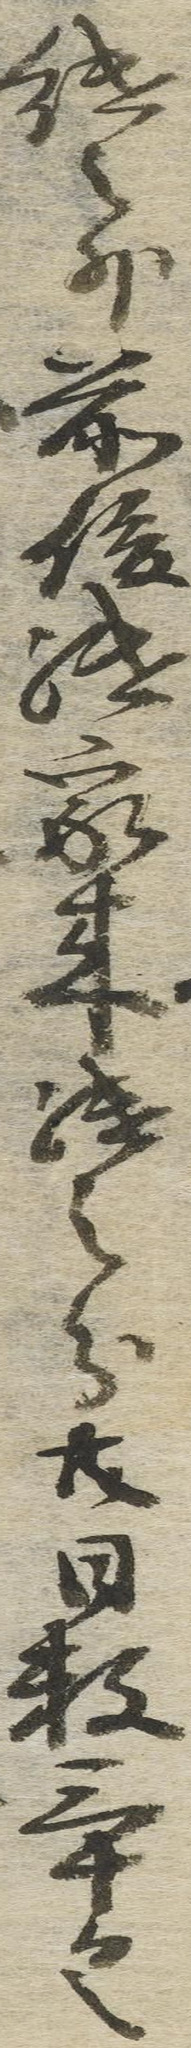継之外前後継家来継之分共日数三十日之
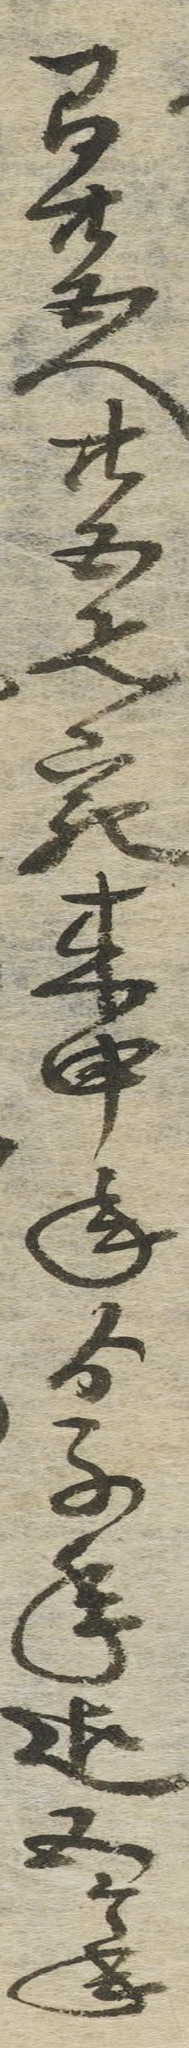間廿五人廿五疋宛来申年ゟ子年迄五ヶ年
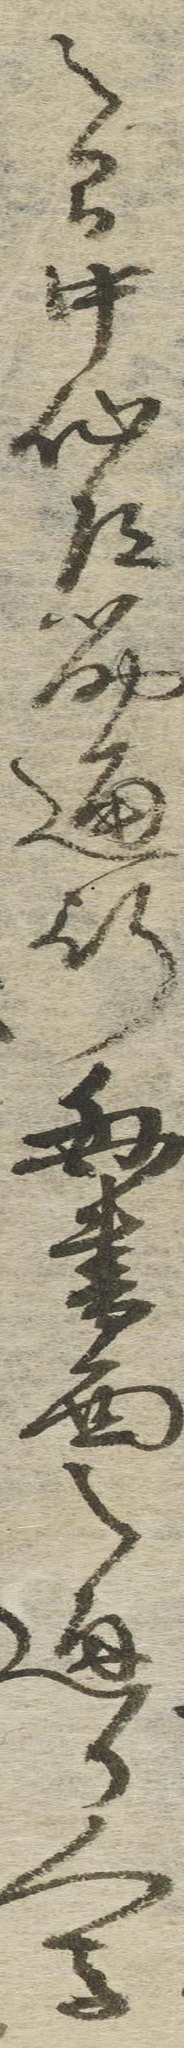間中仙道筋通行再書面之通り人馬
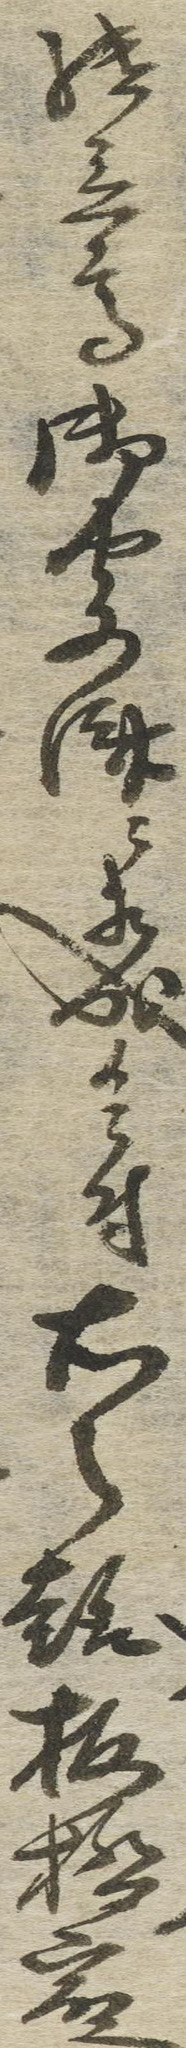継立馬御聞済二相成候二付右之趣板橋宿へ
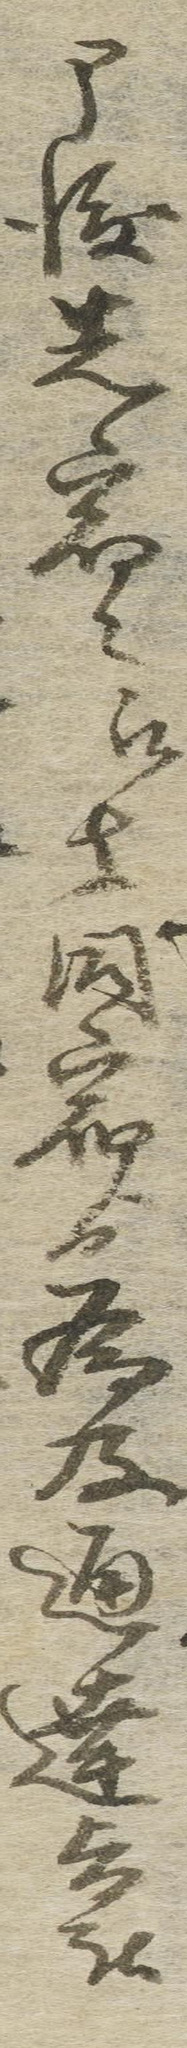申渡先々宿々江は同宿ゟ為及通達旨被
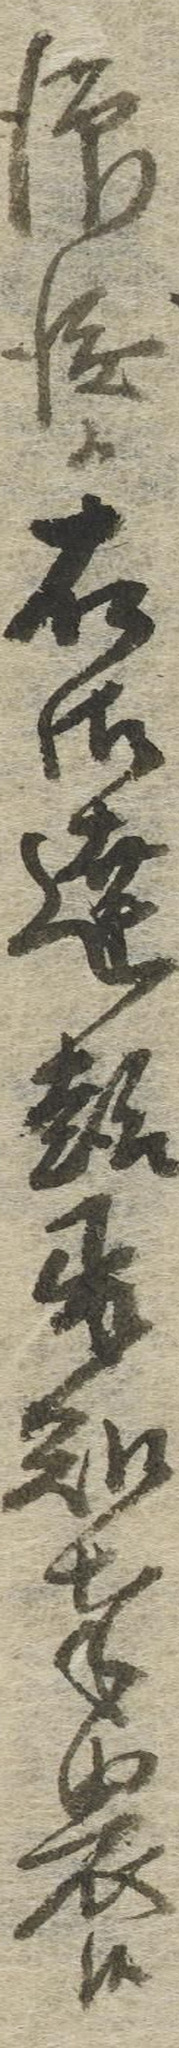仰渡候右御達趣承知奉畏候
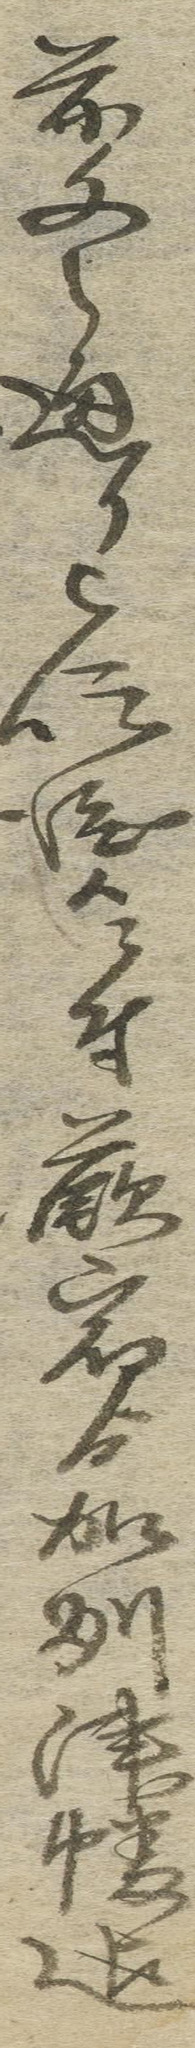前文之通り被仰渡候二付蕨宿ゟ加州津幡迄
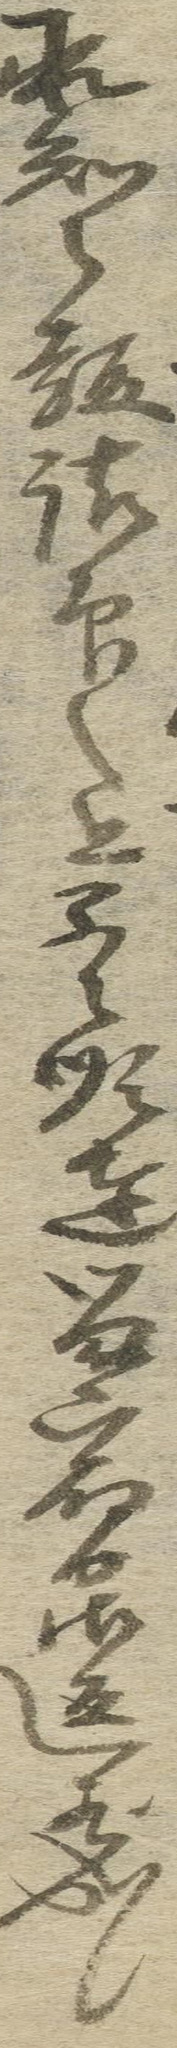承知之趣請印之上早々順達留宿御返可被成候
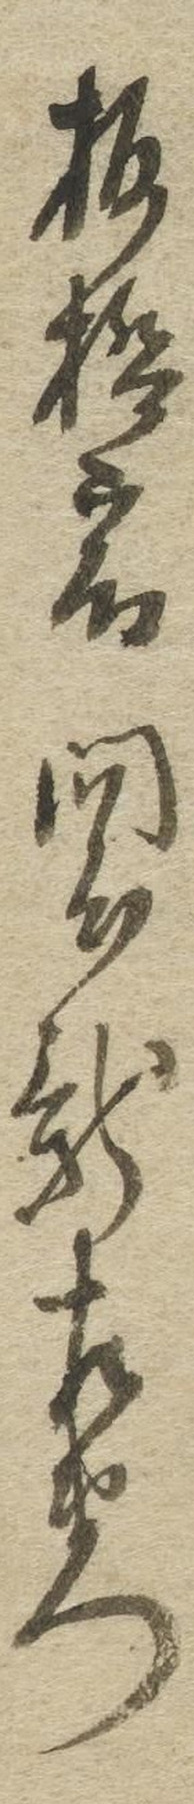板橋宿問屋新右衛門

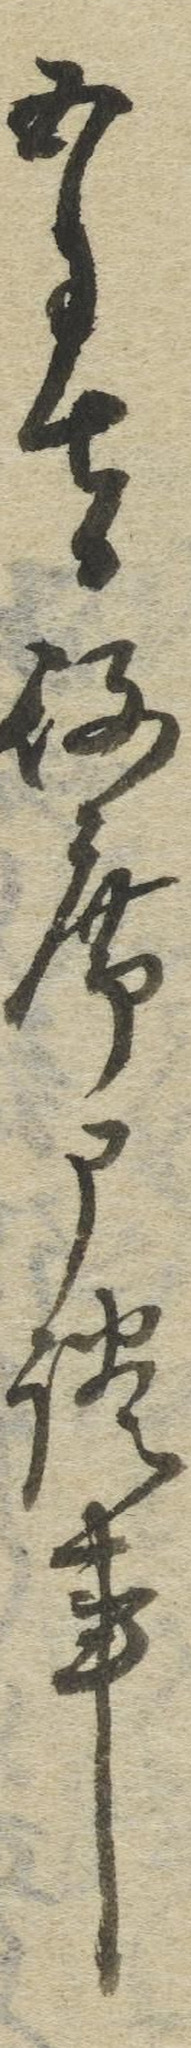五月七日役席申談候事
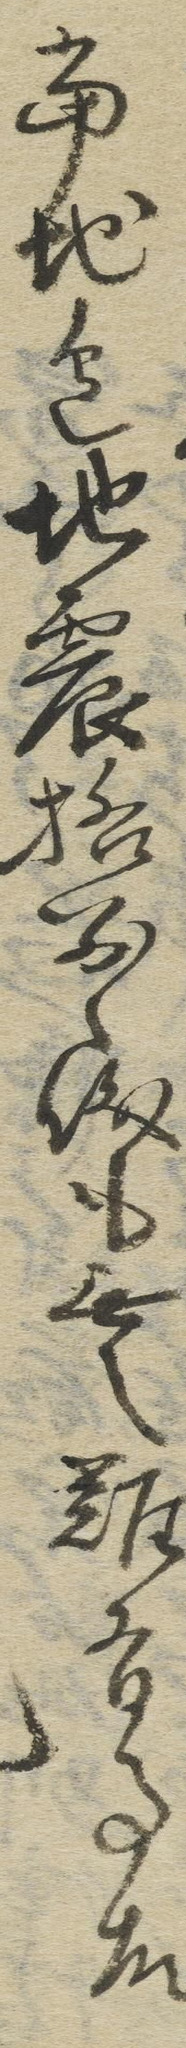当地辺地震格別之儀も無之難有事故
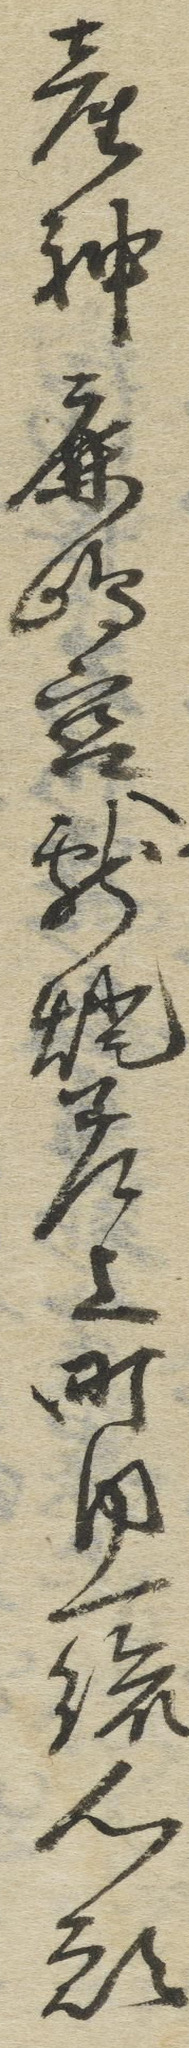産神鹿嶋宮へ献燈差上町内一統心願
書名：信濃越後　地震書留
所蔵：東京大学地震研究所図書室 Earthquake Research Institute Library, The University of Tokyo, JAPAN
